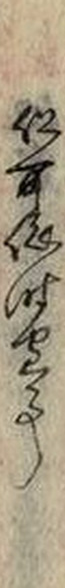但可依時宜事
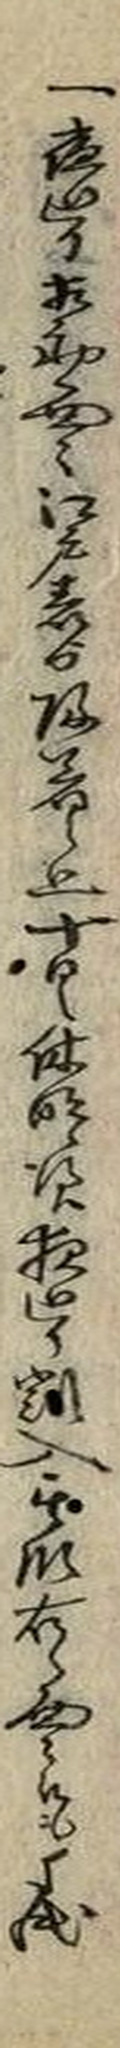一夜廻り相勤面々江戸表ゟ帰着之上十日之休明候得は夜廻り割入其段右之面々えも手紙
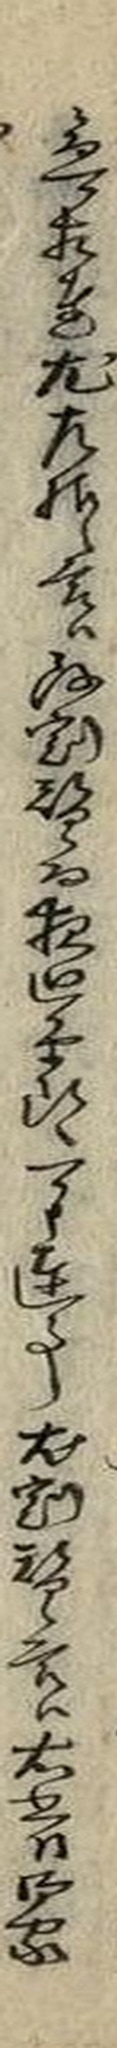にて可相達尤左様之節は致割替候て夜廻筆頭へ可申達事尤割替候節は右書付御家
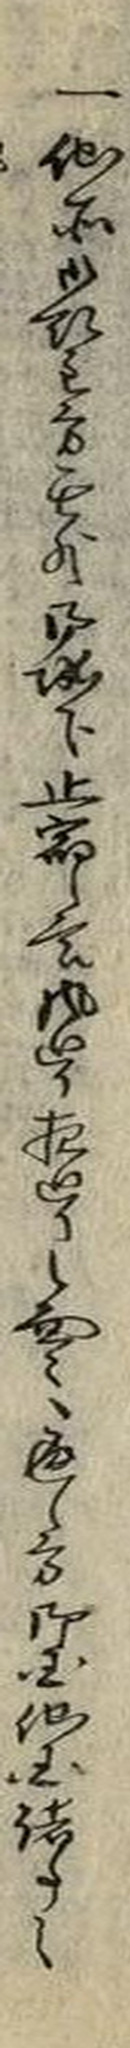一他所御領主方其外御城下止宿之節風廻り夜廻り之面々へ通し方御国他国諸事之
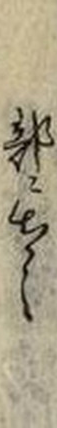部に出之
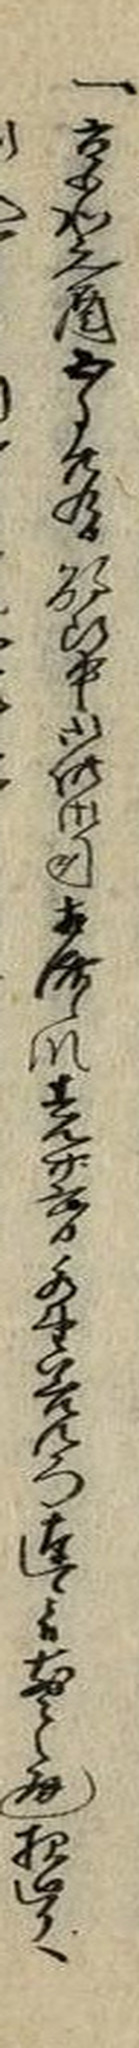一享和元酉五月廿九日触頭中御供御用相済候段去ル廿六日水野善左衛門達候に付前々之通夜廻りへ
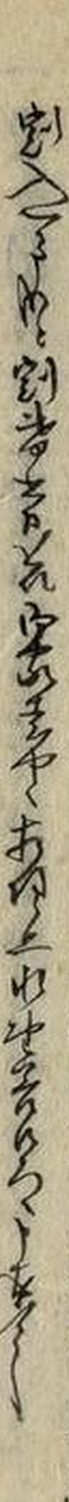割入可申哉と割替書付を以御家老中へ相伺候上水野善左衛門へ申達之
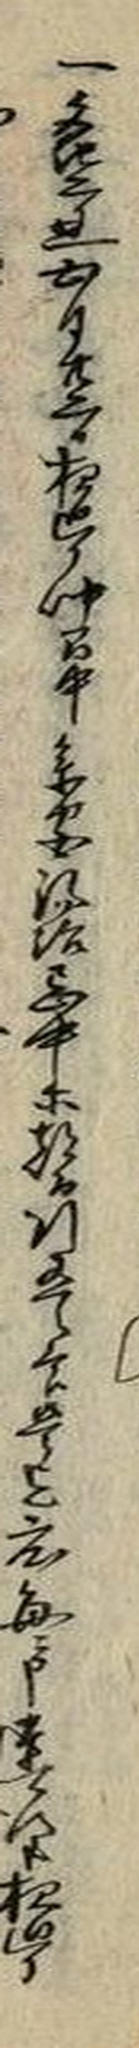一文化二丑五月廿二日夜廻り仲間中参宮湯治忌中等都て引有之節是迄度毎に申達候得共夜廻り
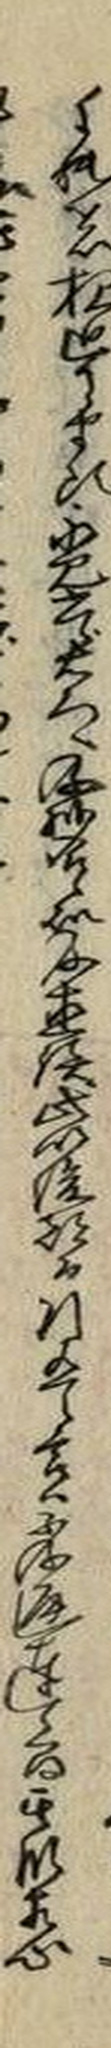手紙を以夜廻り筆頭永見六郎右衛門へ及掛合候処及直談此以後都て引有之節は不及通達候間其段相心
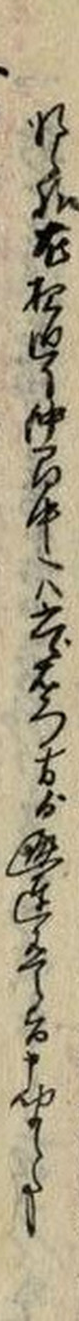得候様右夜廻り仲間中へは六郎右衛門方ゟ通達有之旨申聞候事
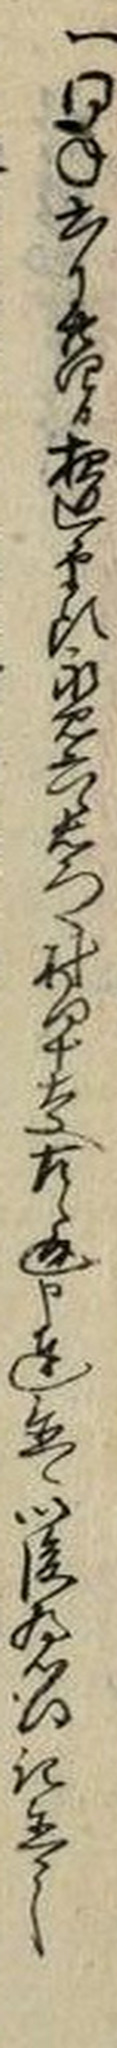一同年六月廿四日夜廻筆頭永見六郎右衛門へ村田十大夫左之通申達置候以後為心得記置之
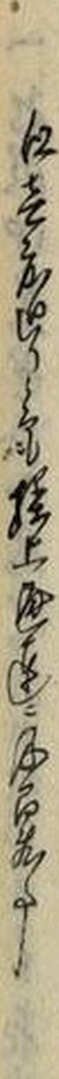但壱度廻りにても繰上通達に及間敷事
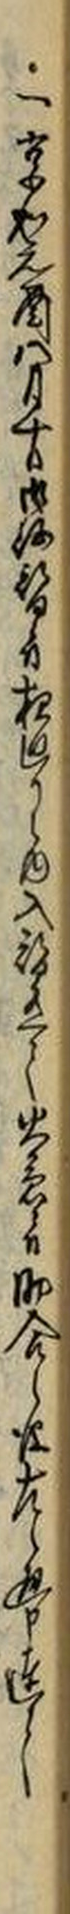一享和元酉八月十日御役替に付夜廻り之内入替有之火急に付助合之儀左之通申達之
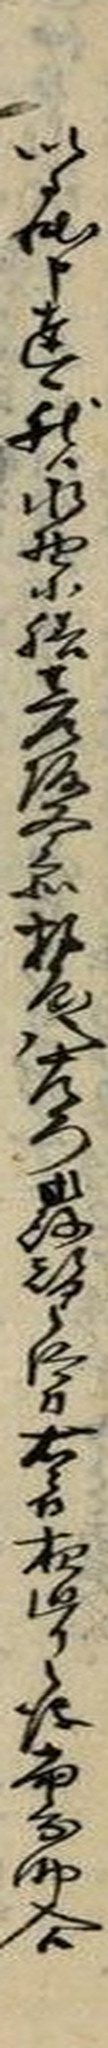以手紙申達候然は水野小膳彦坂又兵衛杤屋八左衛門御役替被仰付右に付夜廻り之儀当分助合
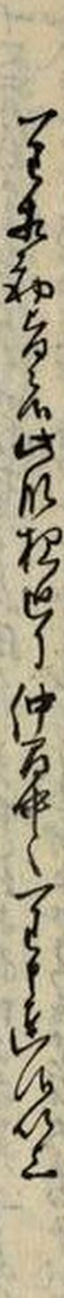可被相勤旨に候此段夜廻り仲間中へ可被申達候以上
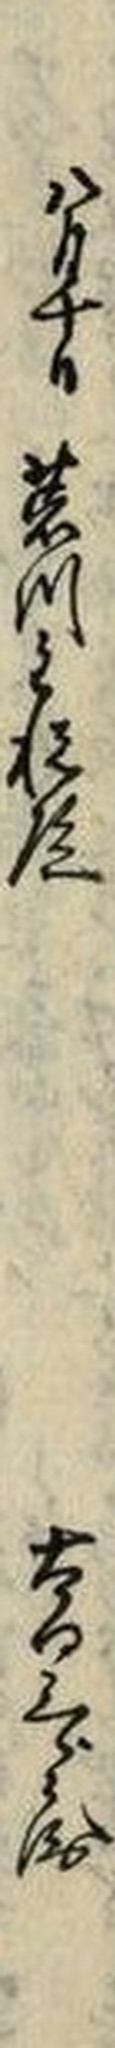八月十日荒川主税殿太田三郎兵衛
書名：御城下諸事之部
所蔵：福井県文書館 Fukui Prefectural Archives
